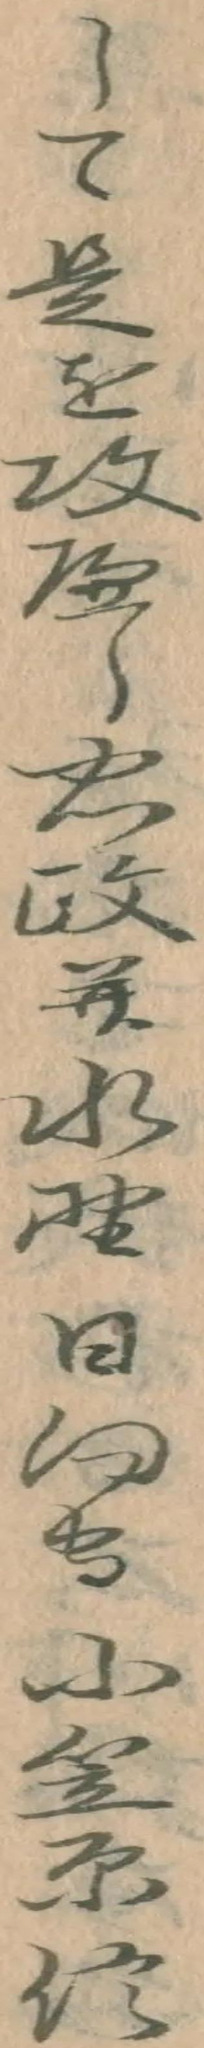して是を攻扁し忠政幷水野日向守小笠原信
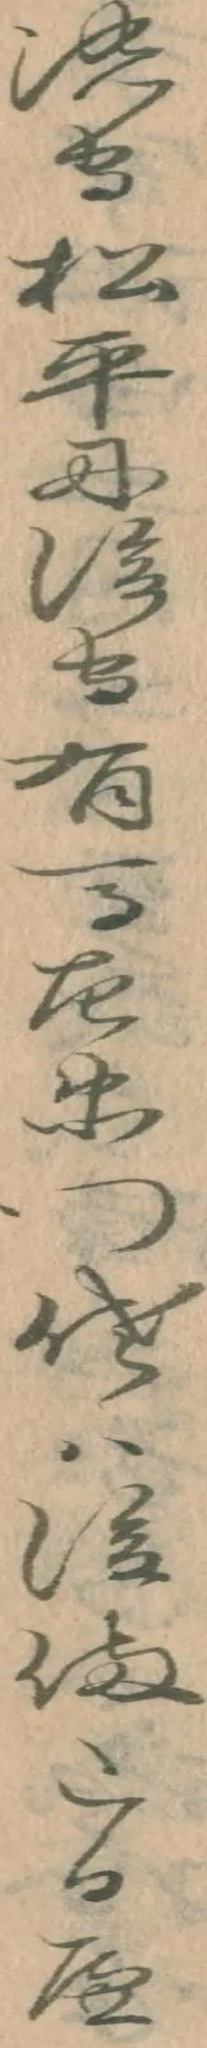濃守松平丹後守有馬左衛門佐は後備たる扁
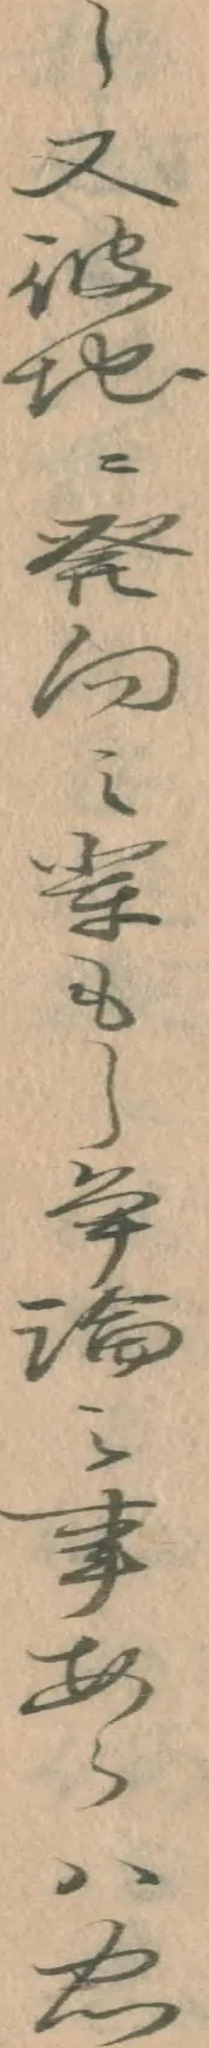し又彼地に発向之輩もし争論之事あらは忠
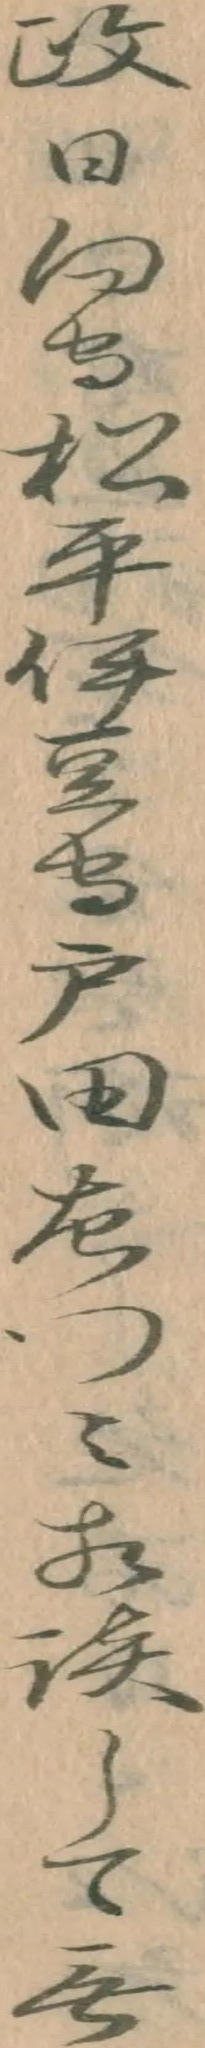政日向守松平伊豆守戸田左門与相談して無
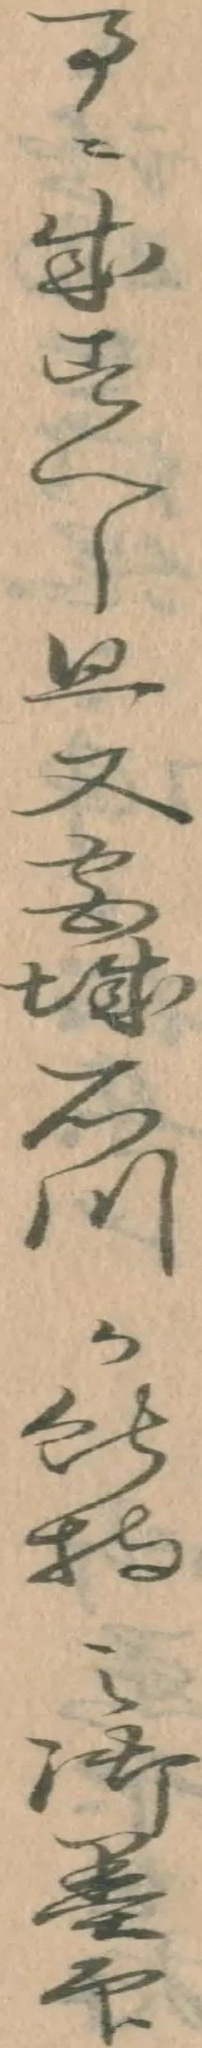事に成春へし且又宮城石川か所持之御黒印
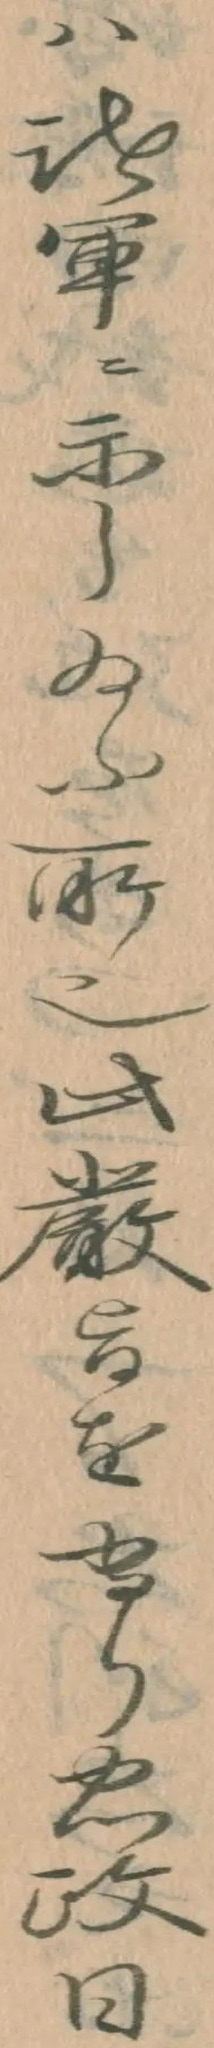は諸軍に示しゐふ所也此厳旨を守り忠政日
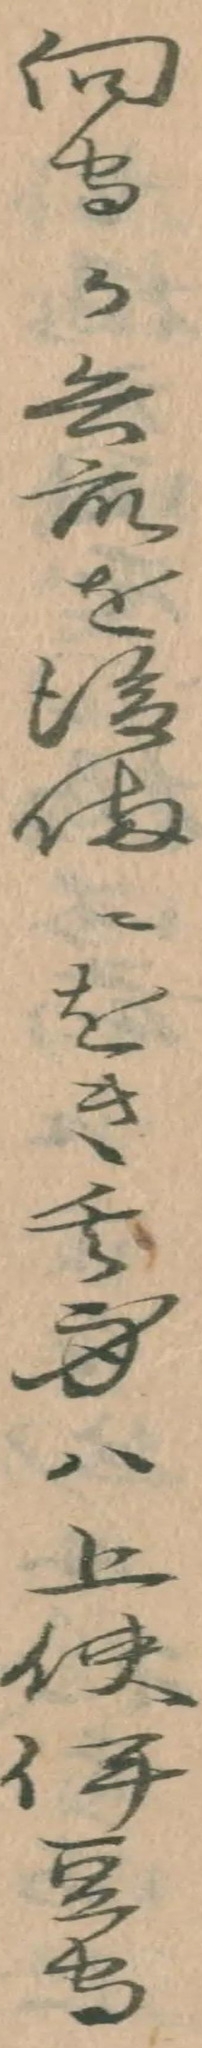向守か兵衆を後備にをき其身は上使伊豆守
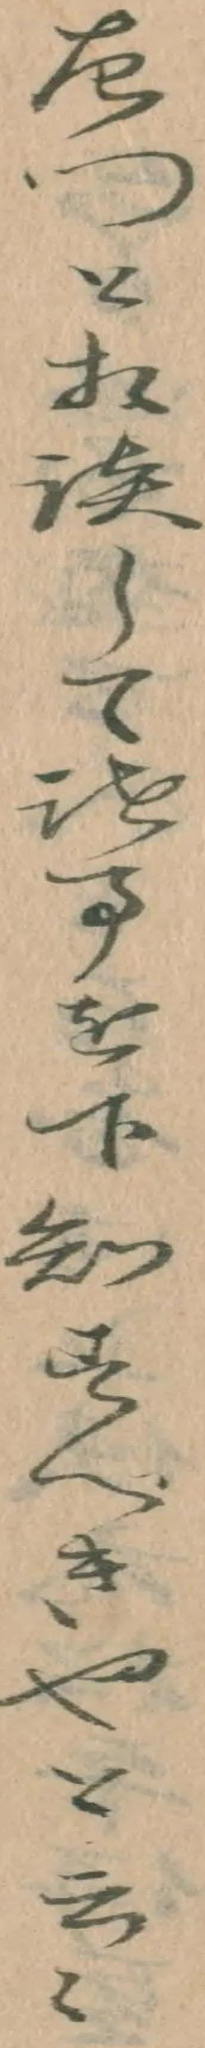左門と相談して諸事を下知春へきやと云々
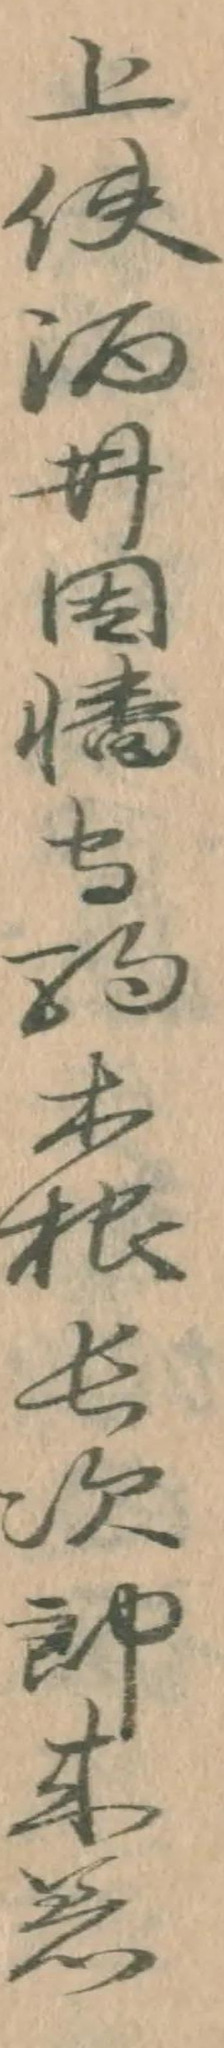上使酒井因幡守駒木根長次郎来着
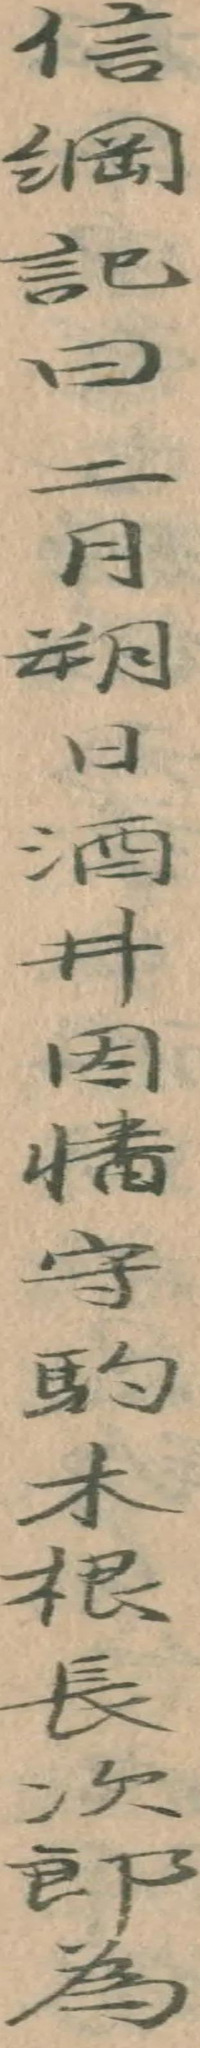信綱記曰二月朔日酒井因幡守駒木根長次郎為
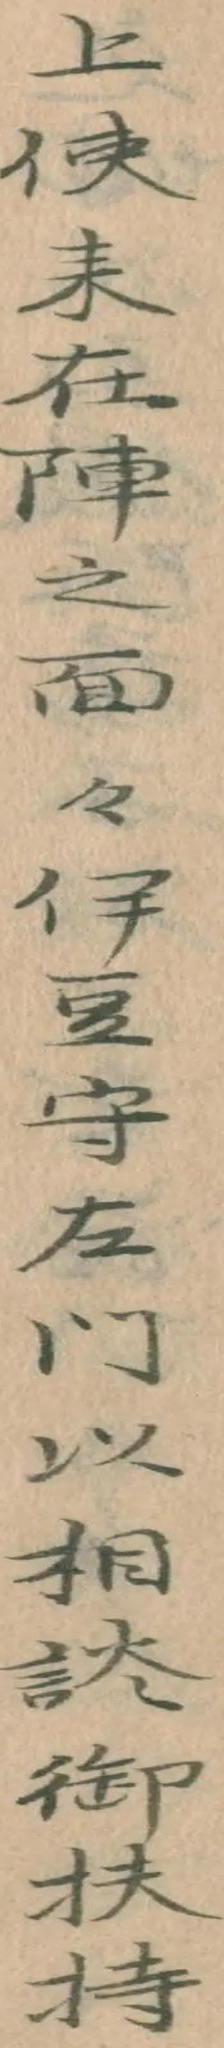上使来在陣之面々伊豆守左門以相談御扶持
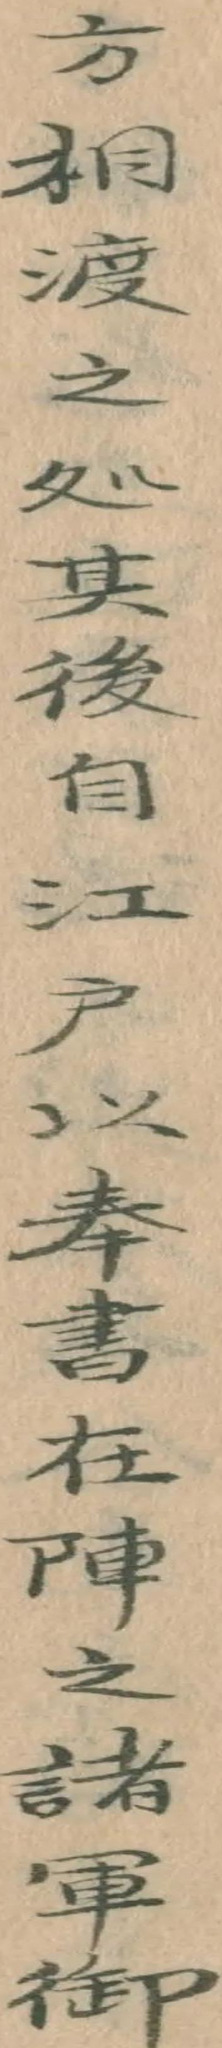方相渡之処其後自江戸以奉書在陣之諸軍御
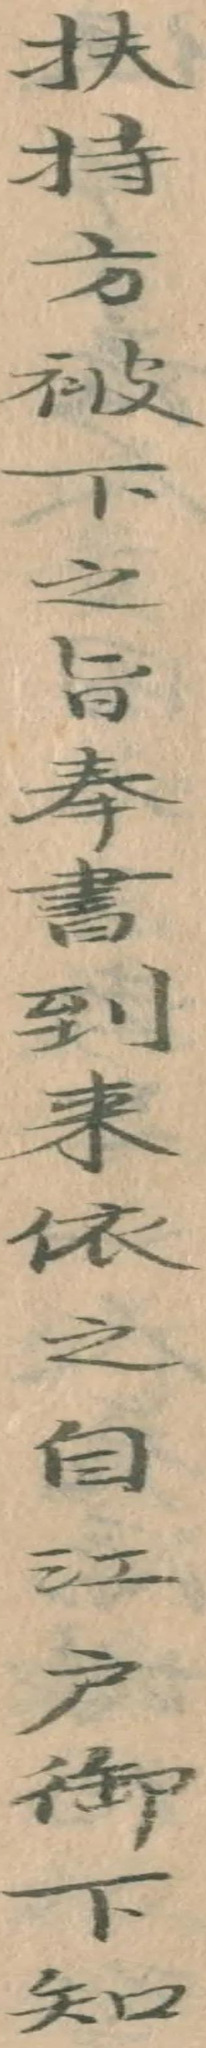扶持方被下之旨奉書到来依之自江戸御下知
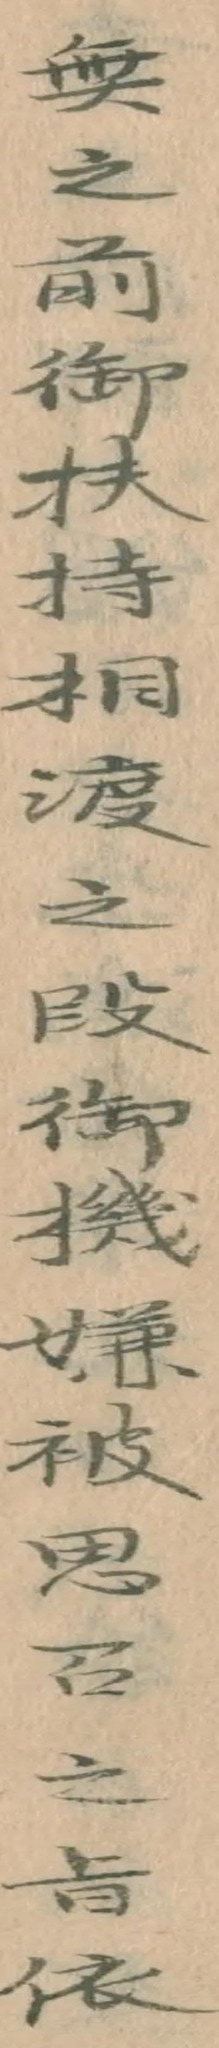無之前御扶持相渡之段御機嫌被思召之旨依
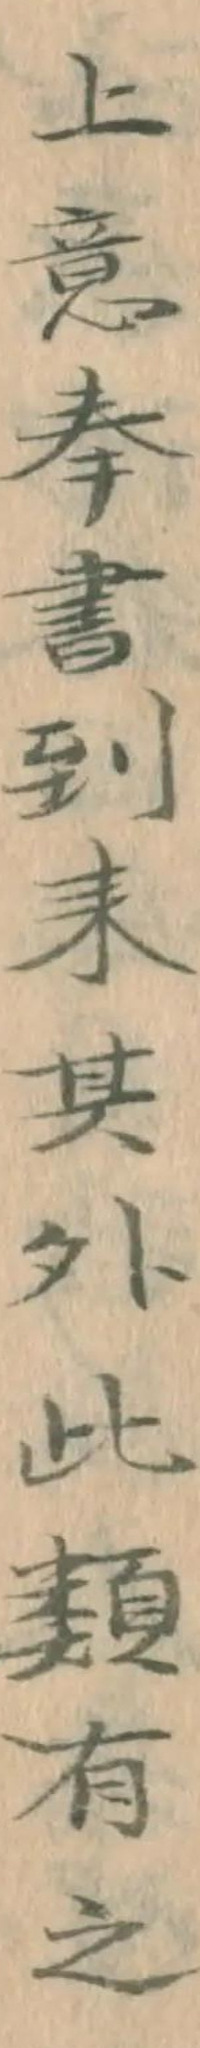上意奉書到来其外此類有之

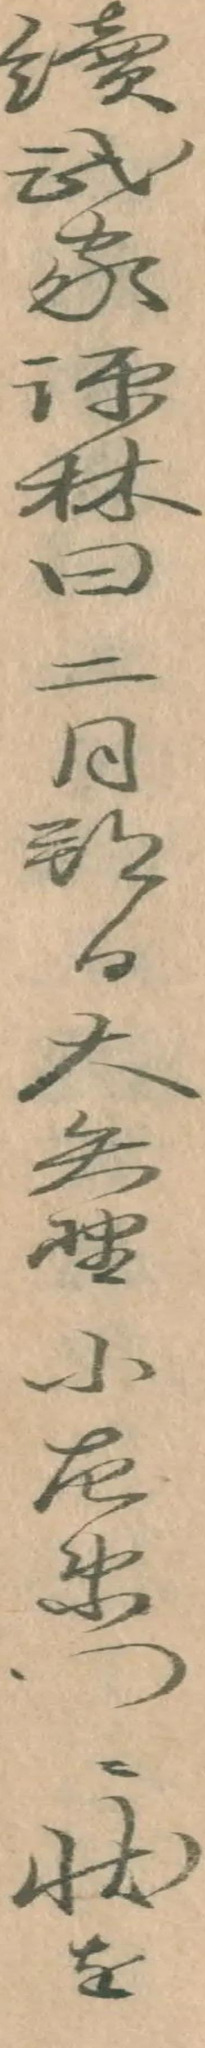続武家評林曰二月朔日大矢野小左衛門に状を
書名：切支丹御退治記 49巻. [6]
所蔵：国立国会図書館 National Diet Library, JAPAN
